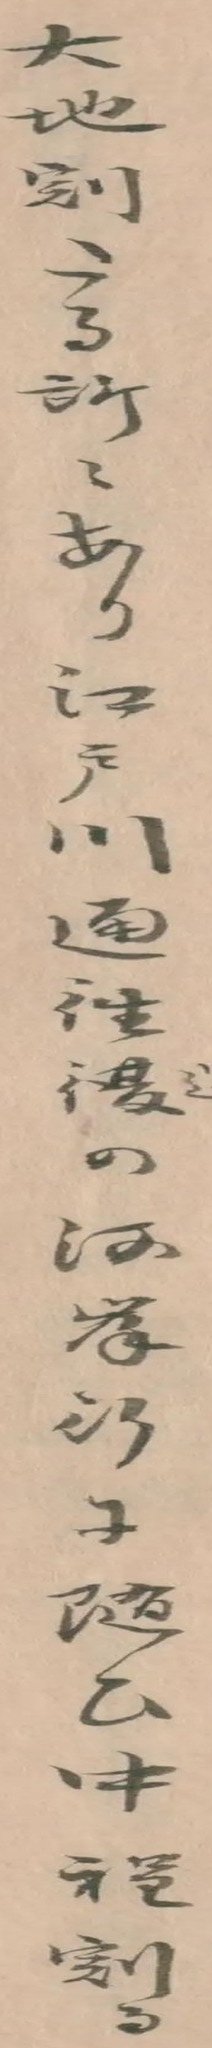大地割たる所々あり江戸川通往還の河岸行に随ひ中程割る
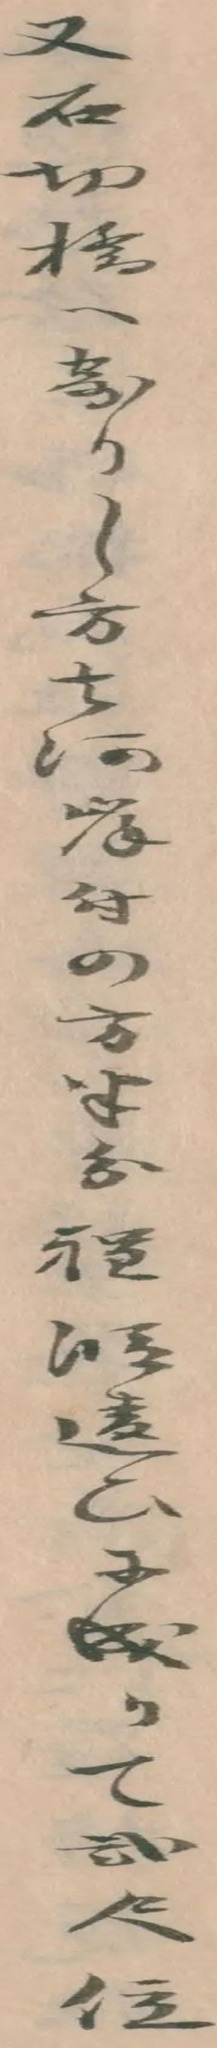又石切橋へ寄りし方は河岸付の方半分程段違ひに成りて弐尺位
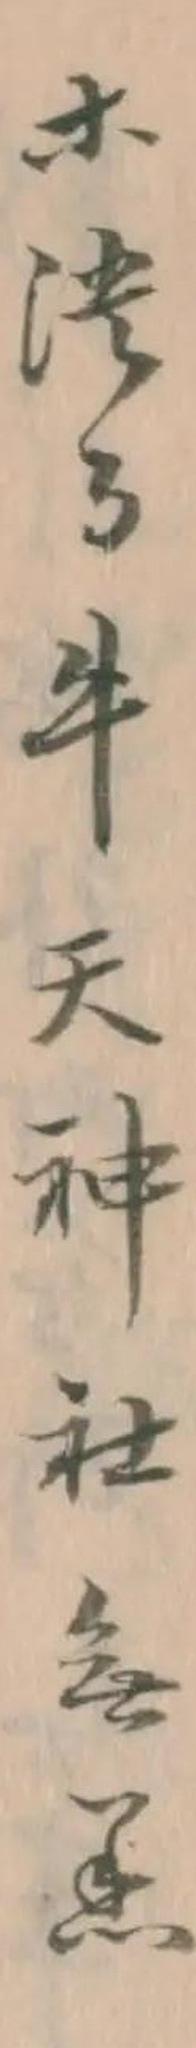等潰る牛天神社無恙
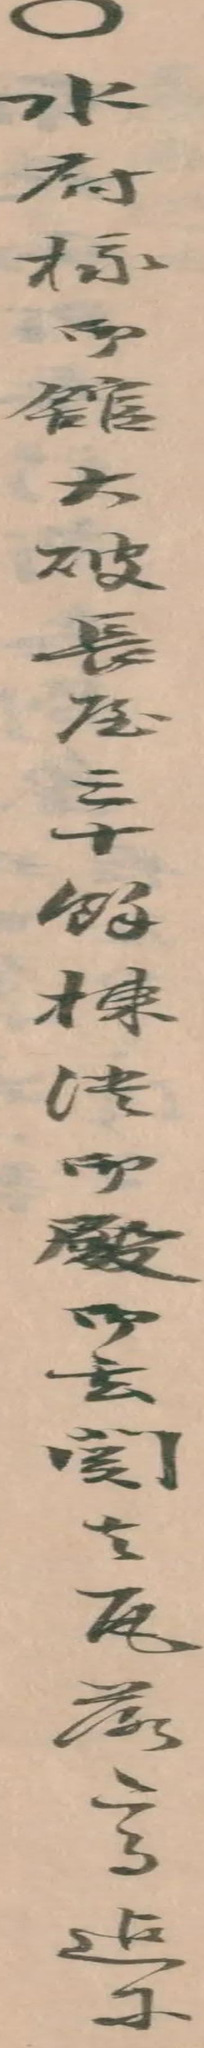〇水府様御館大破長屋三十余棟潰御殿御玄関は瓦落たる迄に
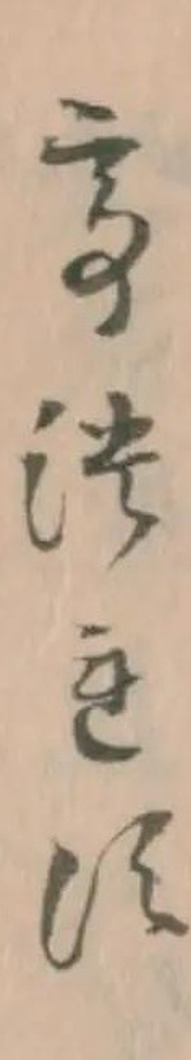て潰れす
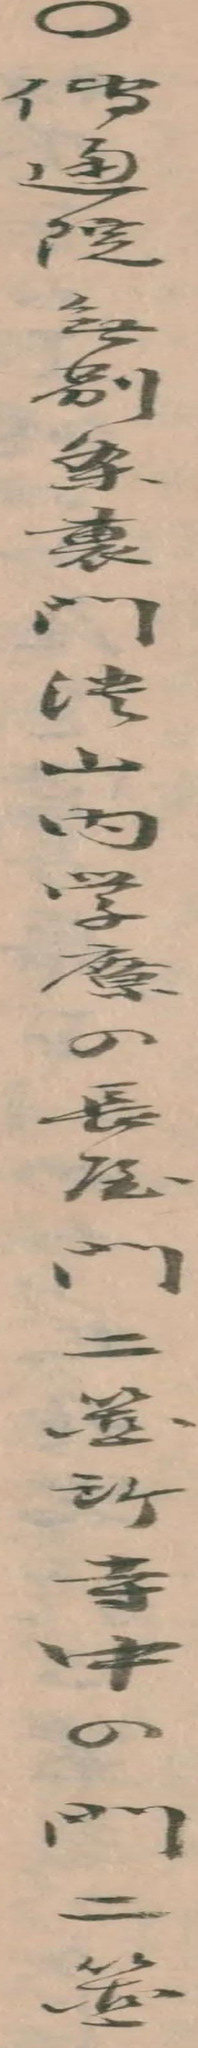〇伝通院無別条裏門潰山内学寮の長屋門二箇所寺中の門二箇
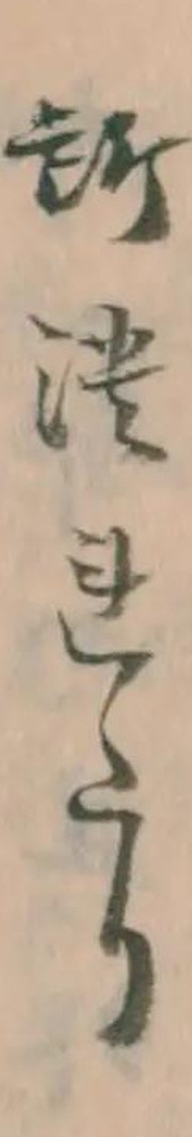所潰れたり
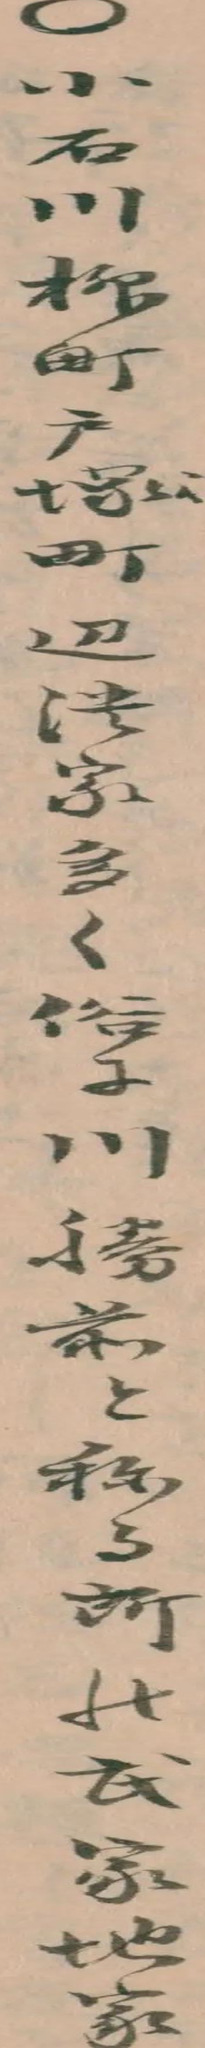〇小石川柳町戸塚町辺潰家多く俗に川勝前と称る所の武家地家
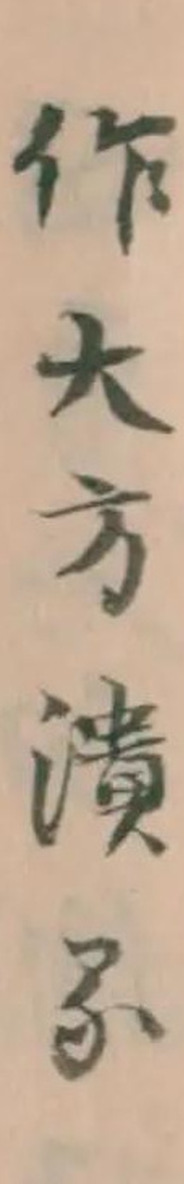作大方潰る
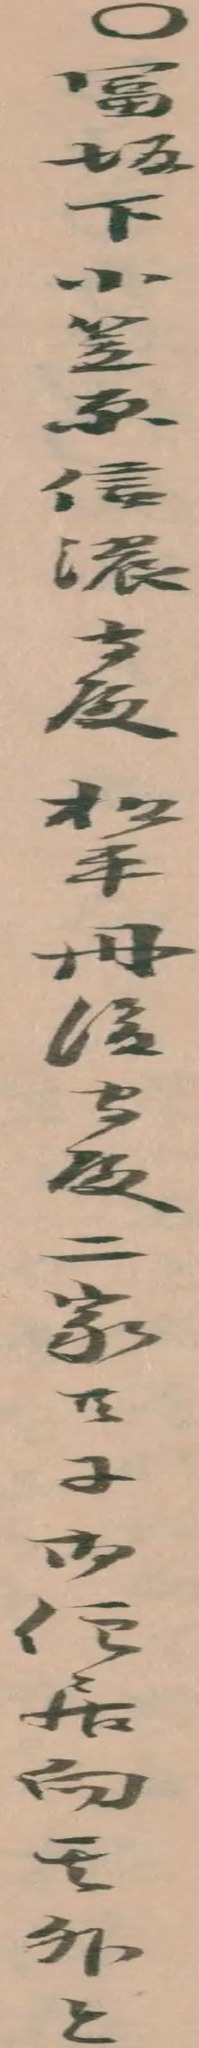〇冨坂下小笠原信濃守殿松平丹後守殿二家共に御住居向其外と
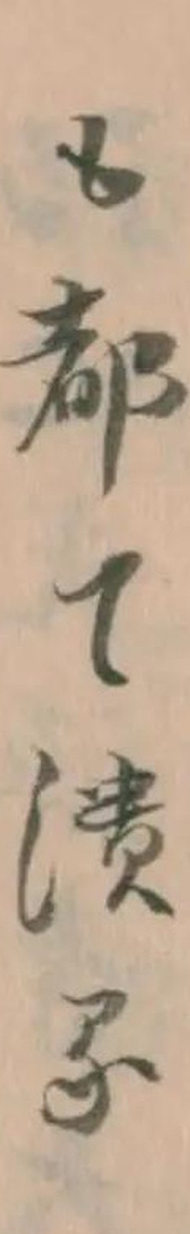も都て潰る
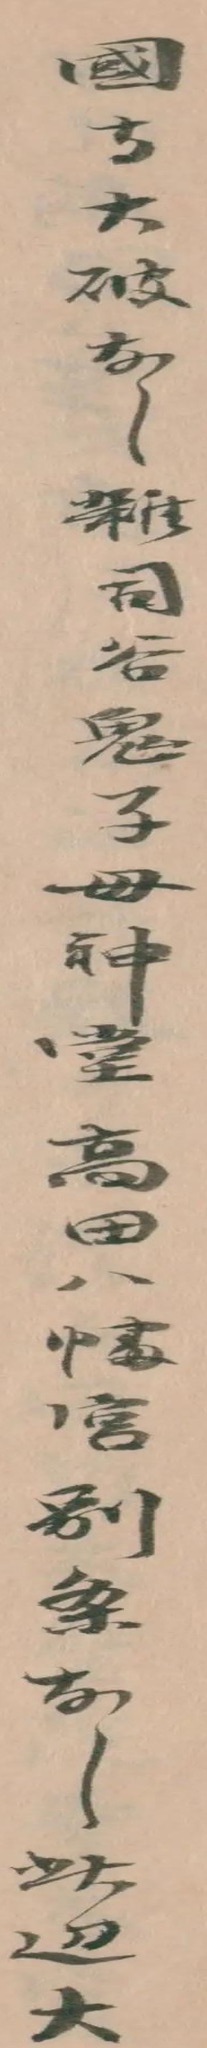国寺大破なし雑司谷鬼子母神堂高田八幡宮別条なし此辺大
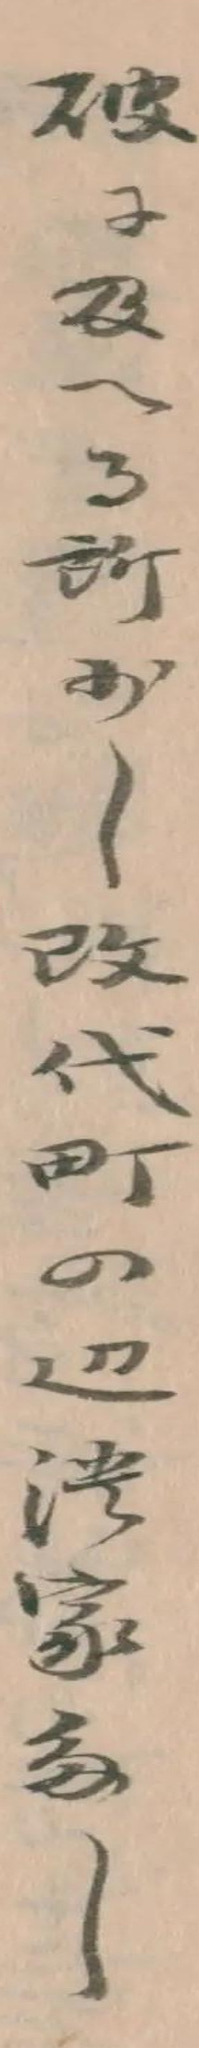破に及へる所少し改代町の辺潰家多し
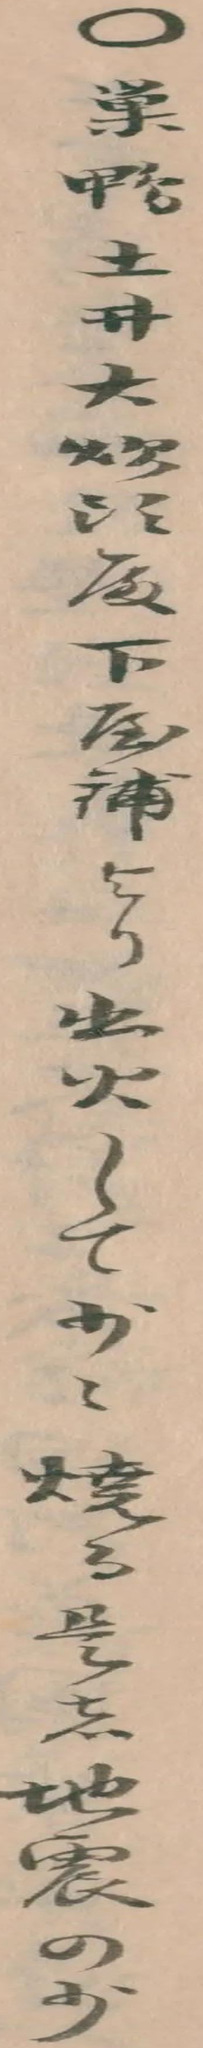〇巣鴨土井大炊頭殿下屋鋪より出火して少々焼る是は地震の少
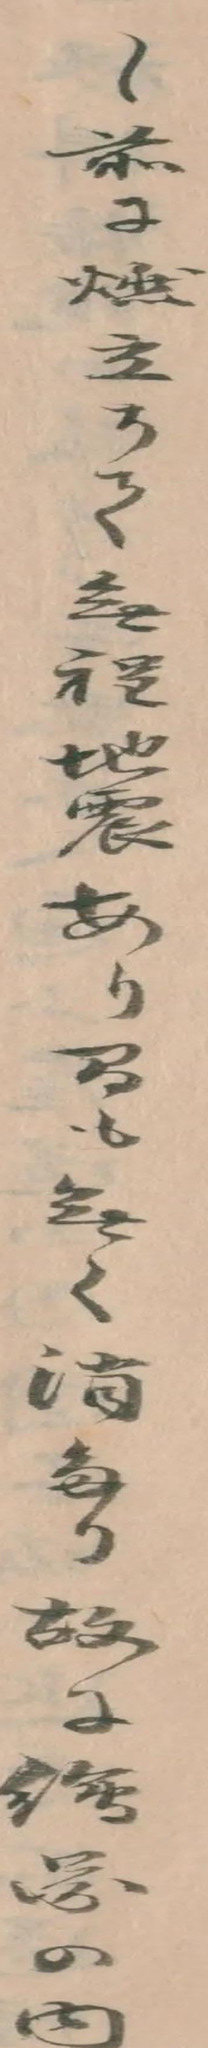し前に燃立ちて無程地震あり間も無く消たり故に絵図の内
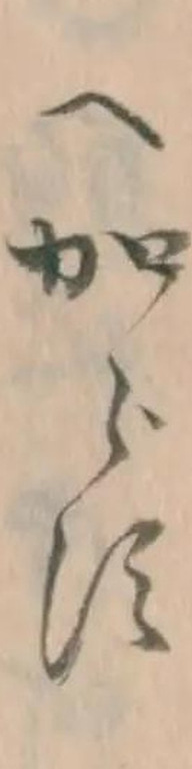へ加らす
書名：地災撮要. 巻7-9(地震之部)
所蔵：国立国会図書館 National Diet Library, JAPAN
